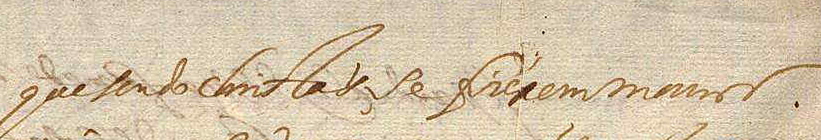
que sendo christās, se fizesem mouros.
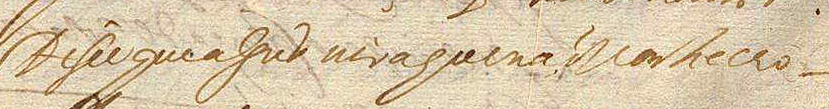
Disse que algūs uira que naõ conheceo
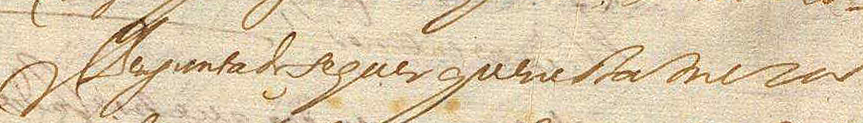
item Perguntado se quer que nesta meza
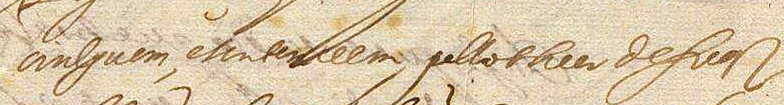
o iulguem, e sentenceem pello theor de suas
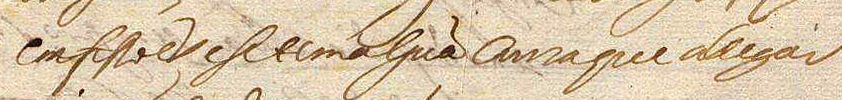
confissoẽs, e se tem alguā couza que allegar
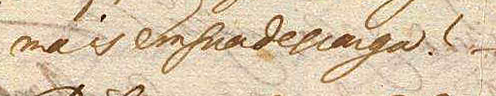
mais em sua descarga?
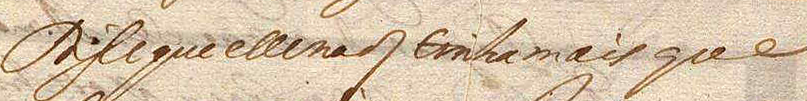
Disse que elle naõ tinha mais que
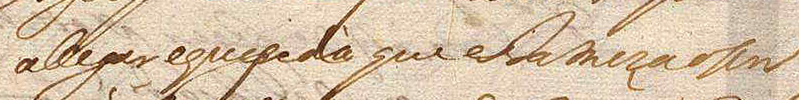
allegar e que pedia que esta meza o sen
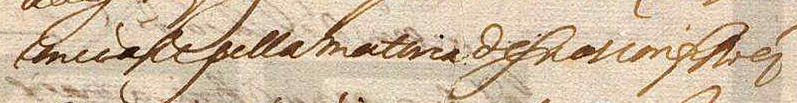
tenciasse pella materia de suas confissoẽs
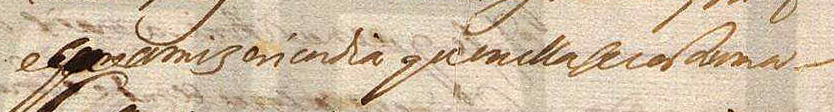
e com a mizericordia que nella se costuma
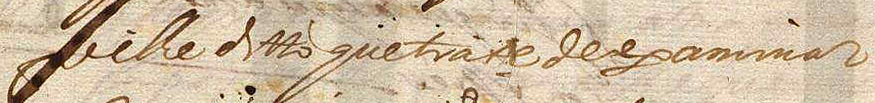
foilhe ditto que trate de examinar
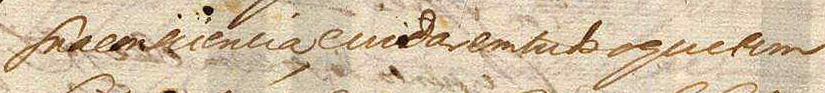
sua consciencia, cuidar em tudo o que tem
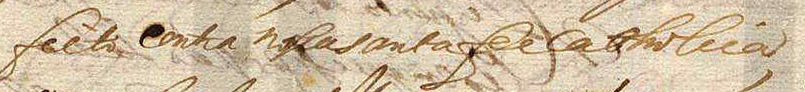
feito contra nossa santa fee catholica
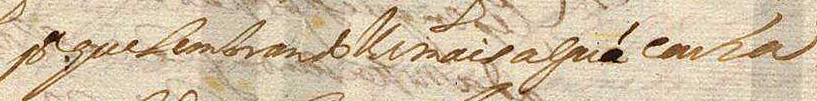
pa. que Lembrandolhe mais alguā couza
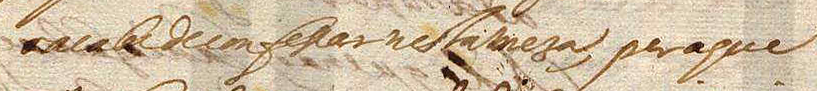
a acabe de confessar nesta meza, pera que
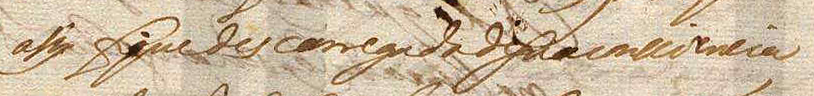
assy fique descarregada de sua consciencia
